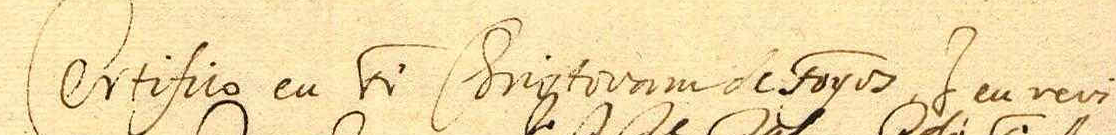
Certifico eu Fr̄ Christovam de Foyos q̄ eu revi
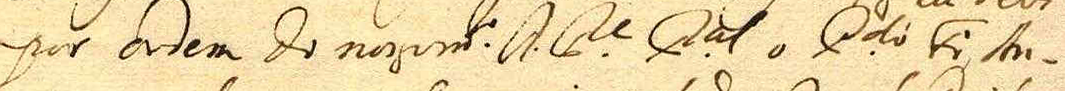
por ordem do noso mto. R. P.e P.al o P.do Fr An
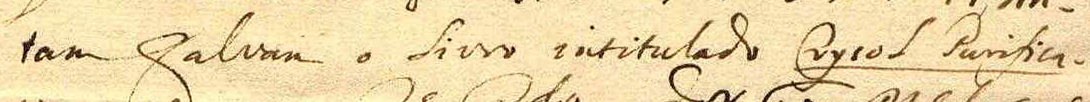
tam Galvam o Livro intitulado Crysol Purifica
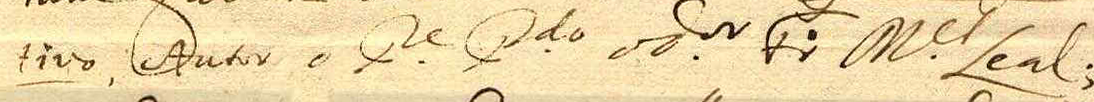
tivo, Autor o P.e P.do o d.or Fr M.el Leal;
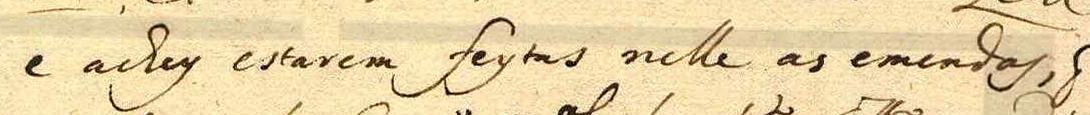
e achey estarem feytas nelle as emendas, q̄
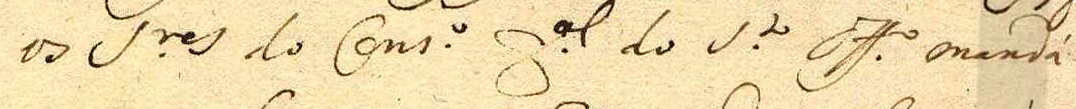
os S.res do Cons.o G.al do S.to Off.o mandá
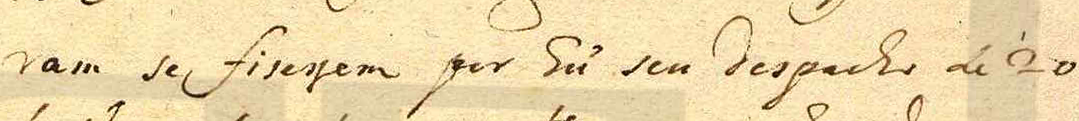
ram se fisessem por hū seu despacho de 20
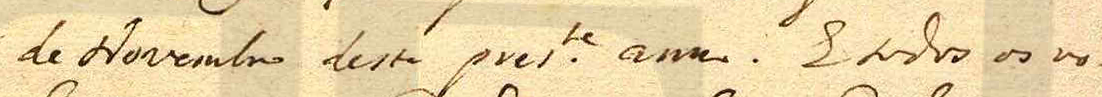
de Novembro deste pres.te anno. E todos os vo
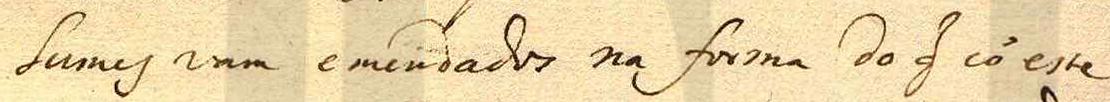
lumes vam emendados na forma do q̄ cō este
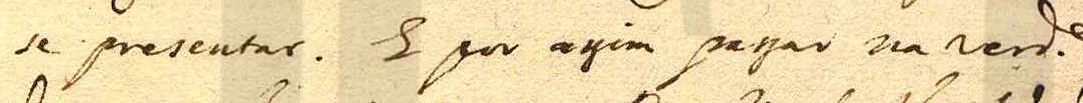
se presentar. E por assim passar na verd.e,
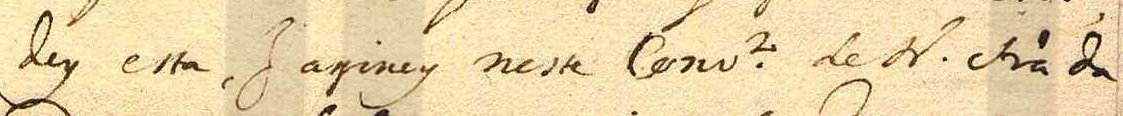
dey esta, q̄ assiney neste Conv.to de N. Srā da
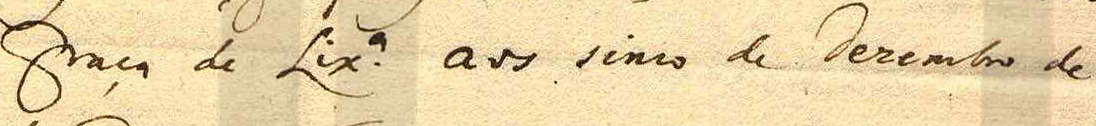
Graça de Lix.a aos sinco de dezembro de
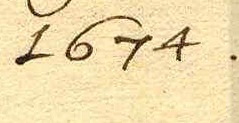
1674.
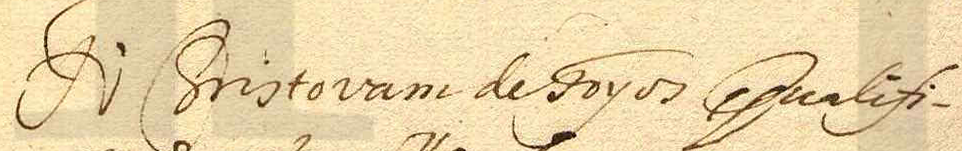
Fr Christovam de Foyos Qualifi
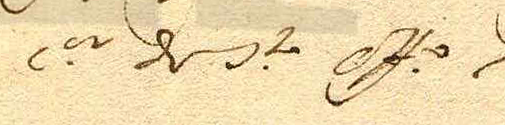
c.or do s.to Off.o
